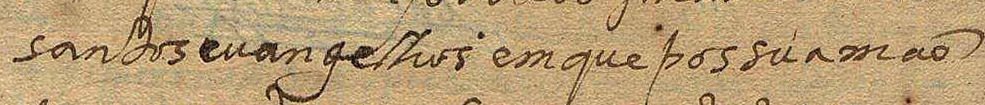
santos euangelhos em que pos sua maõ
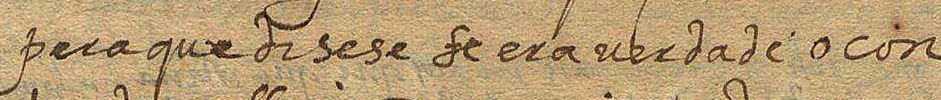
pera que disese se era uerdade o con
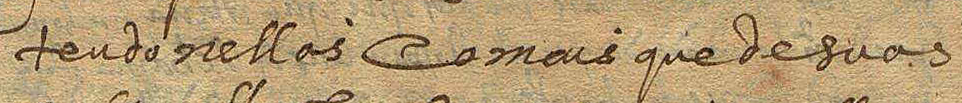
teudo nellas e o mais que de suas
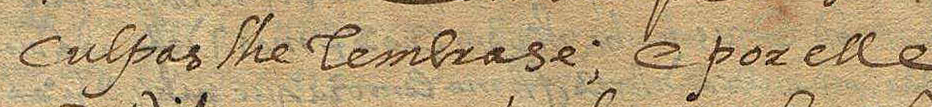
culpas lhe lembrase, e por elle
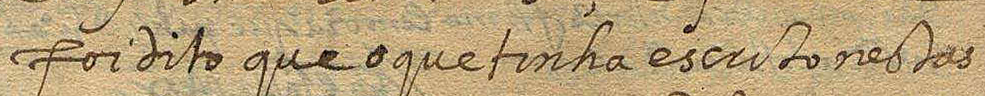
foi dito que o que tinha escrito nestas
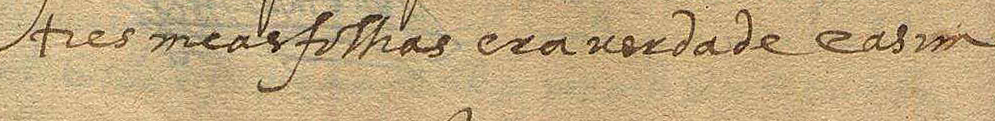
tres meas folhas era uerdade e asim
